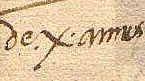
de X. annos
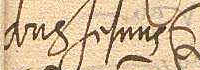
dous JeJuus
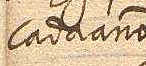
cada an̄o
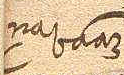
Cna Vaāz
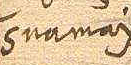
sua may
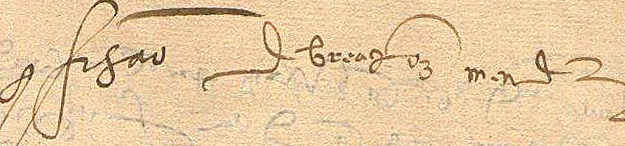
ꝯfisão de breatiz̄ mendez
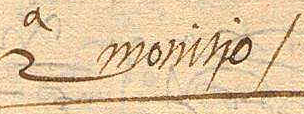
2a monitjo /
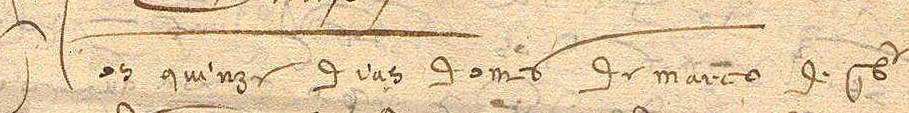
Aos quinze dias do mes de marco de j̄bc
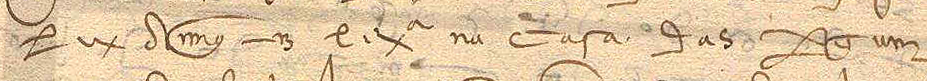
Lix Annꝯ em lixa na Casa das ꝑgum
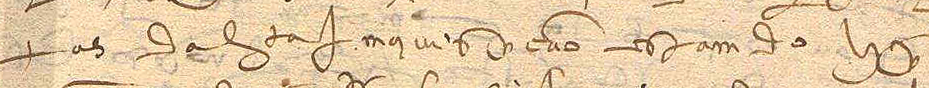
tas da Sta Jmquisycão estamdo hy
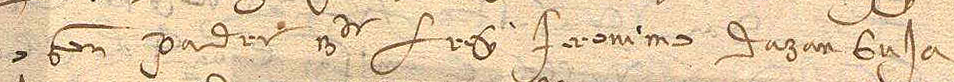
o so̅r padre mte frey Jeronimo dazanbuJa
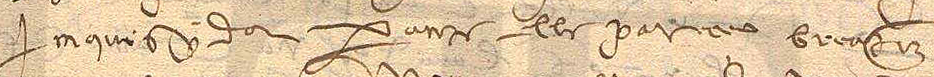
Jmquisydor ꝑante elle pareçeo breatiz
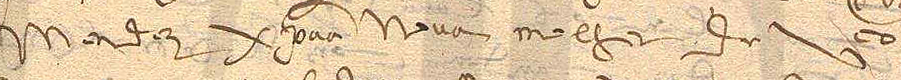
Mendez xpāa Noua molher de Vco
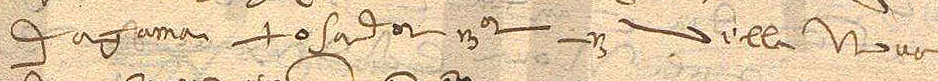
da gama tosador mor em Villa Noua
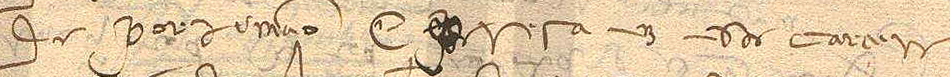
de portimão e presa em este carçere
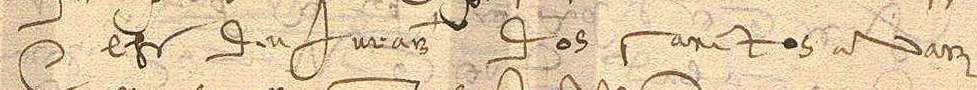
e lhe deu Juramto dos sanctos avam
